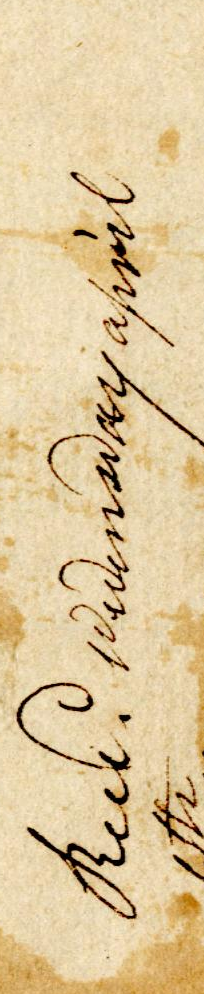Rece^d. Wednesday April
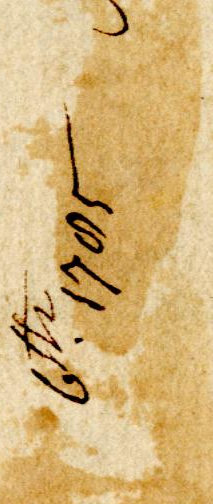6^th 1785
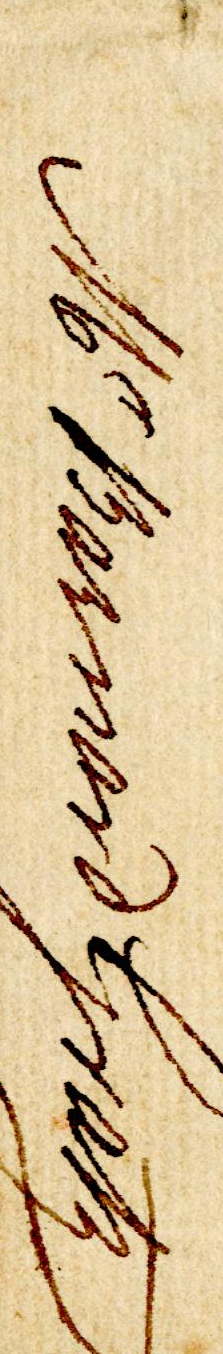M^r Barnard Gratz
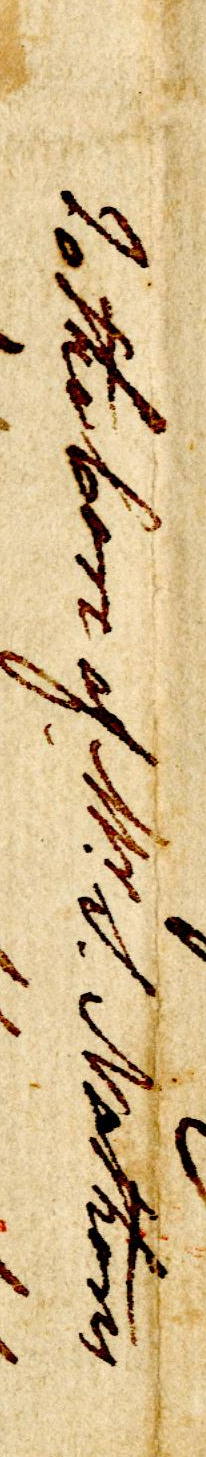to the care of M^r S. Nathans
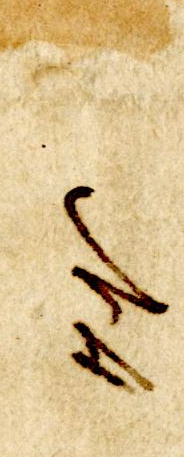N4
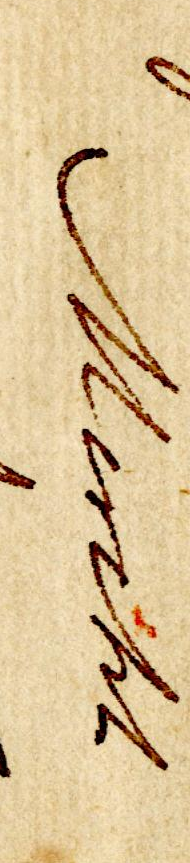Merch^t
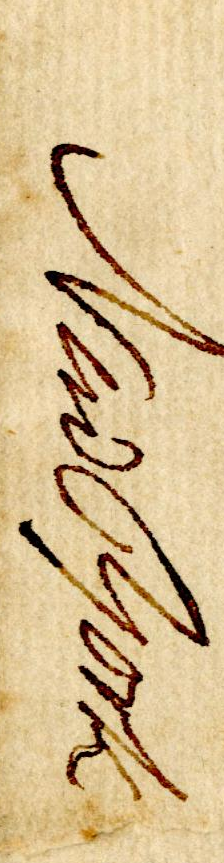New York
